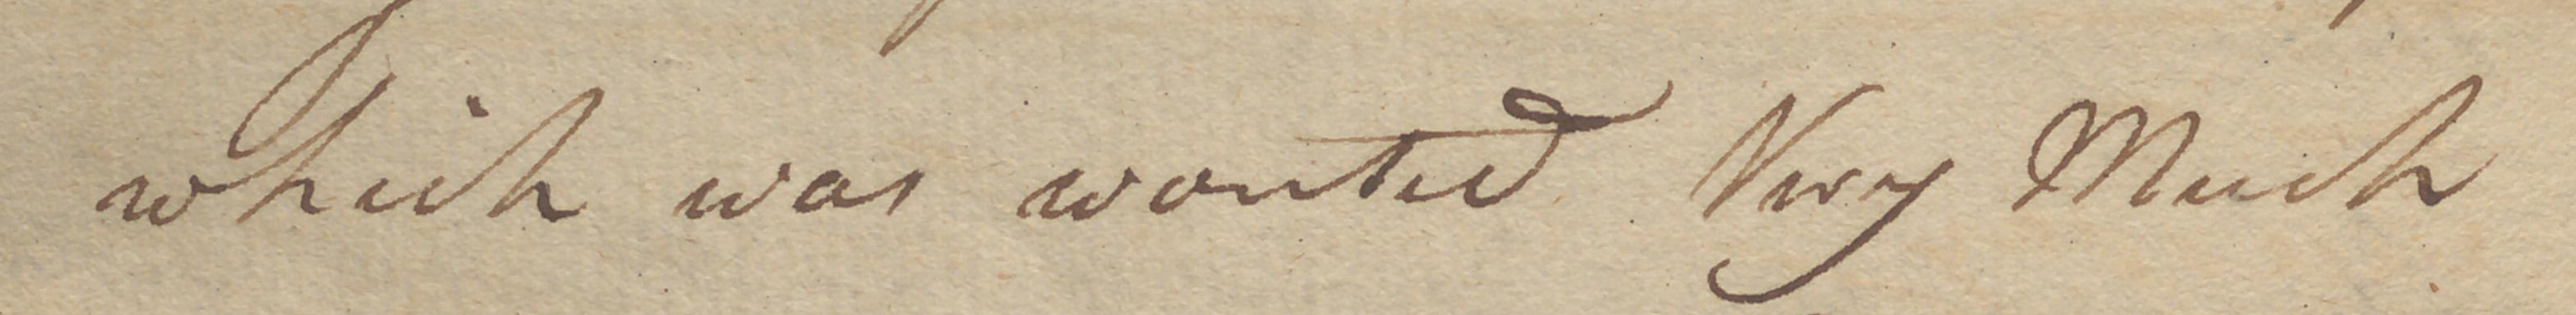which was wanted Very Much
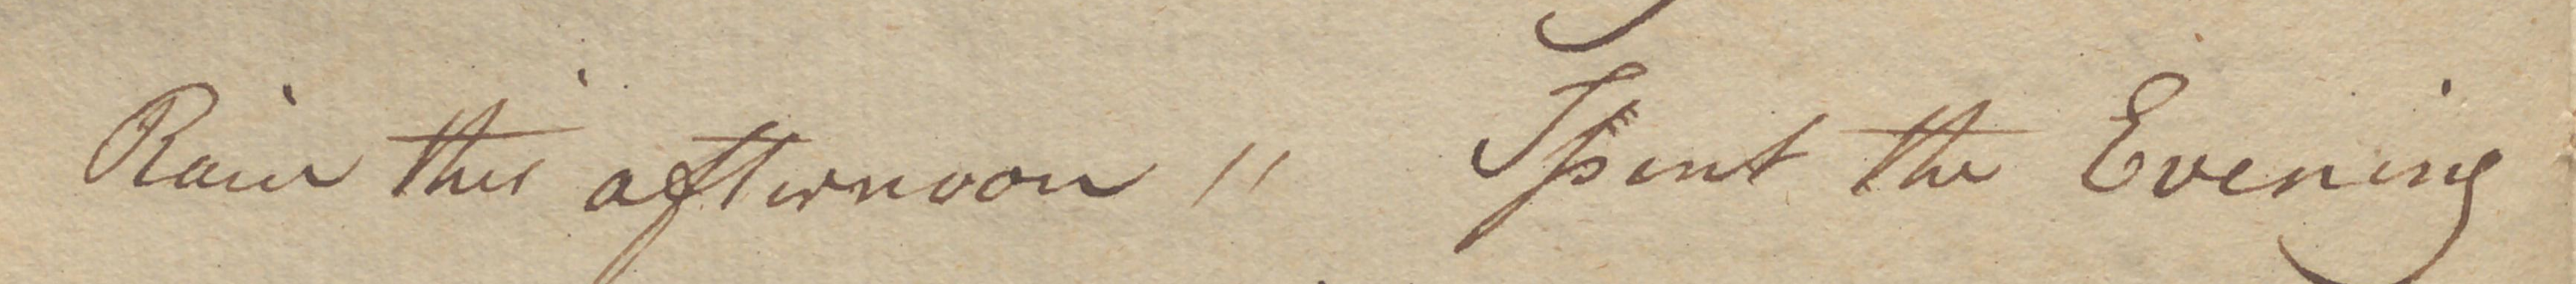Rain this afternoon spent the Evening
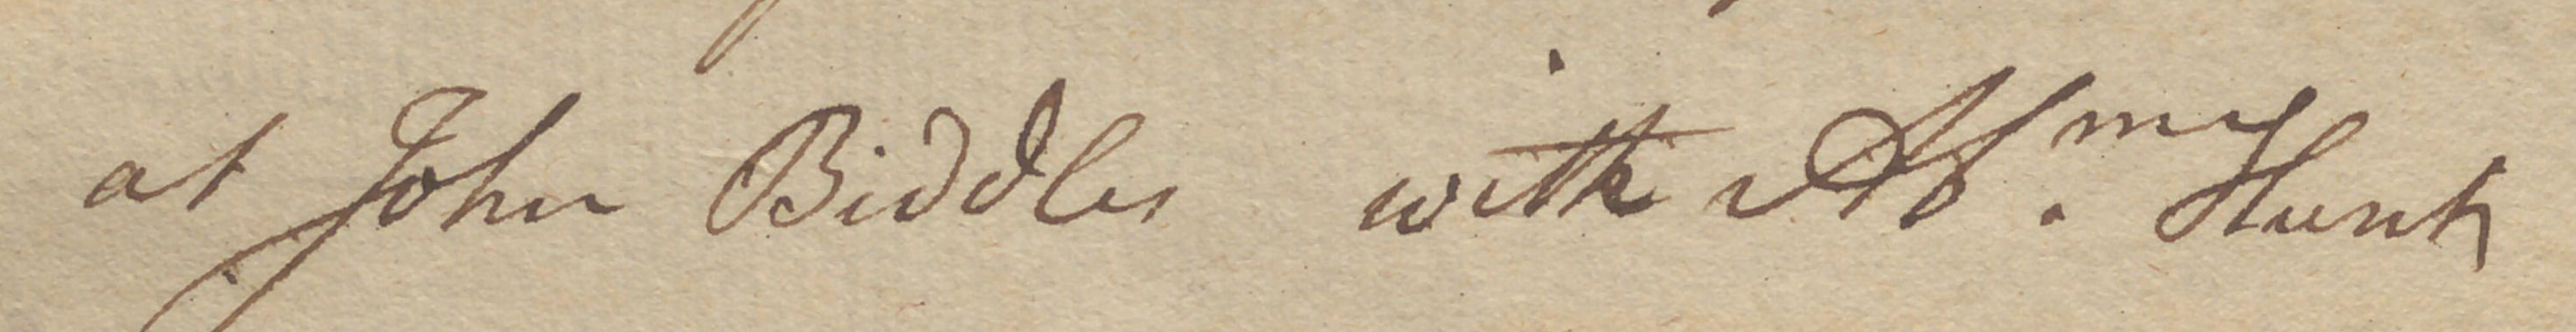at John Biddles with Ab^m. Hunt
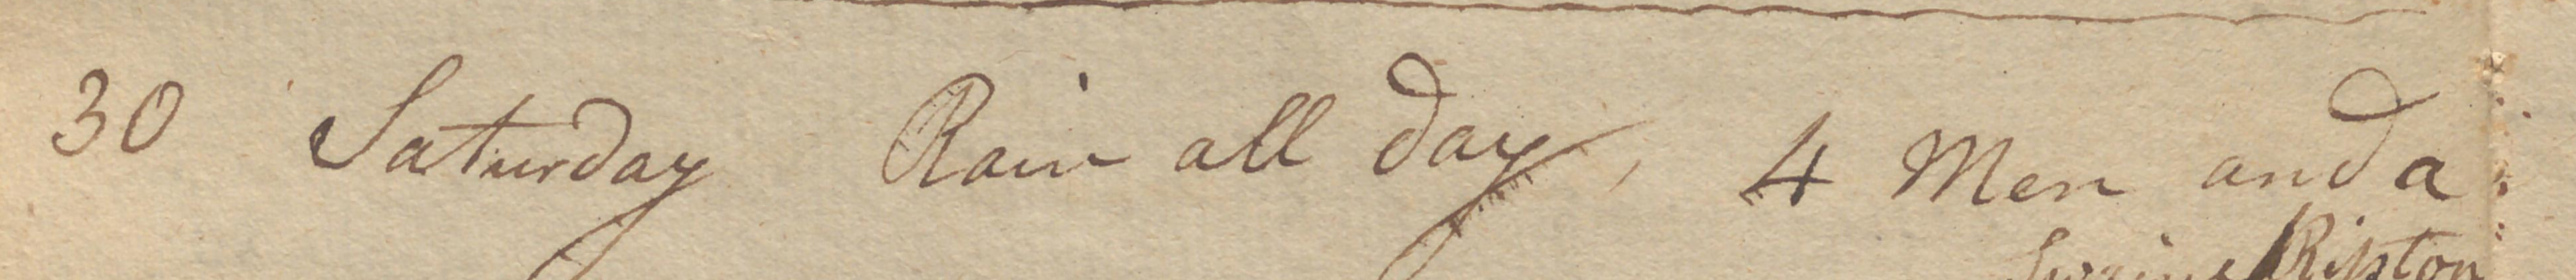30 Saturday Rain all day, 4 Men and a
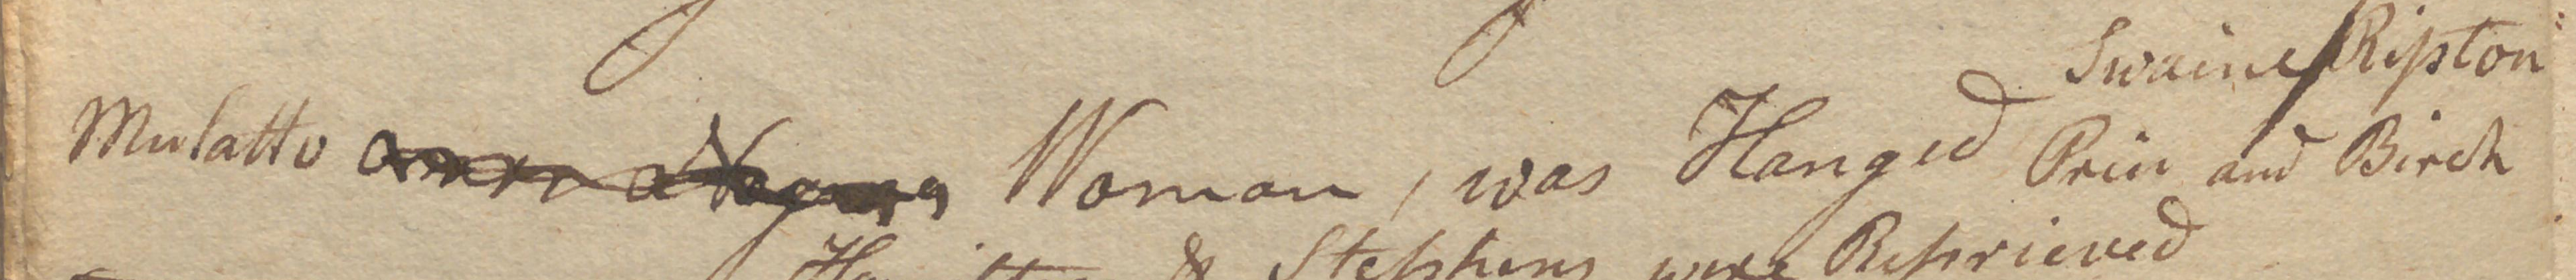Mulalto [or a Negro] Woman, was Hanged Price and Birch
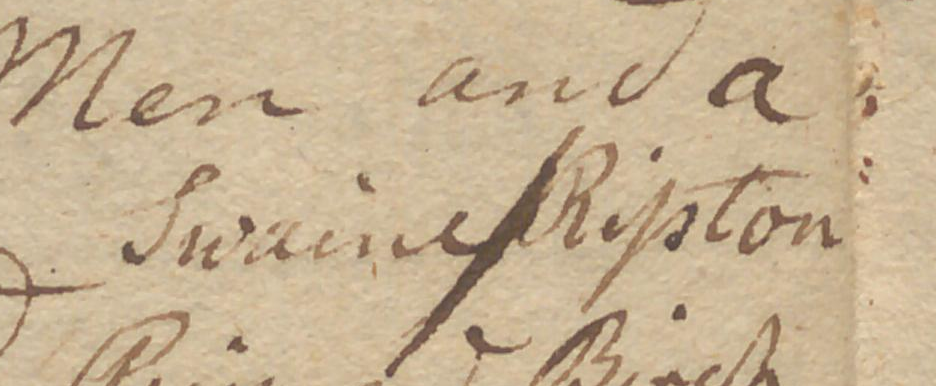Swaine Ripton
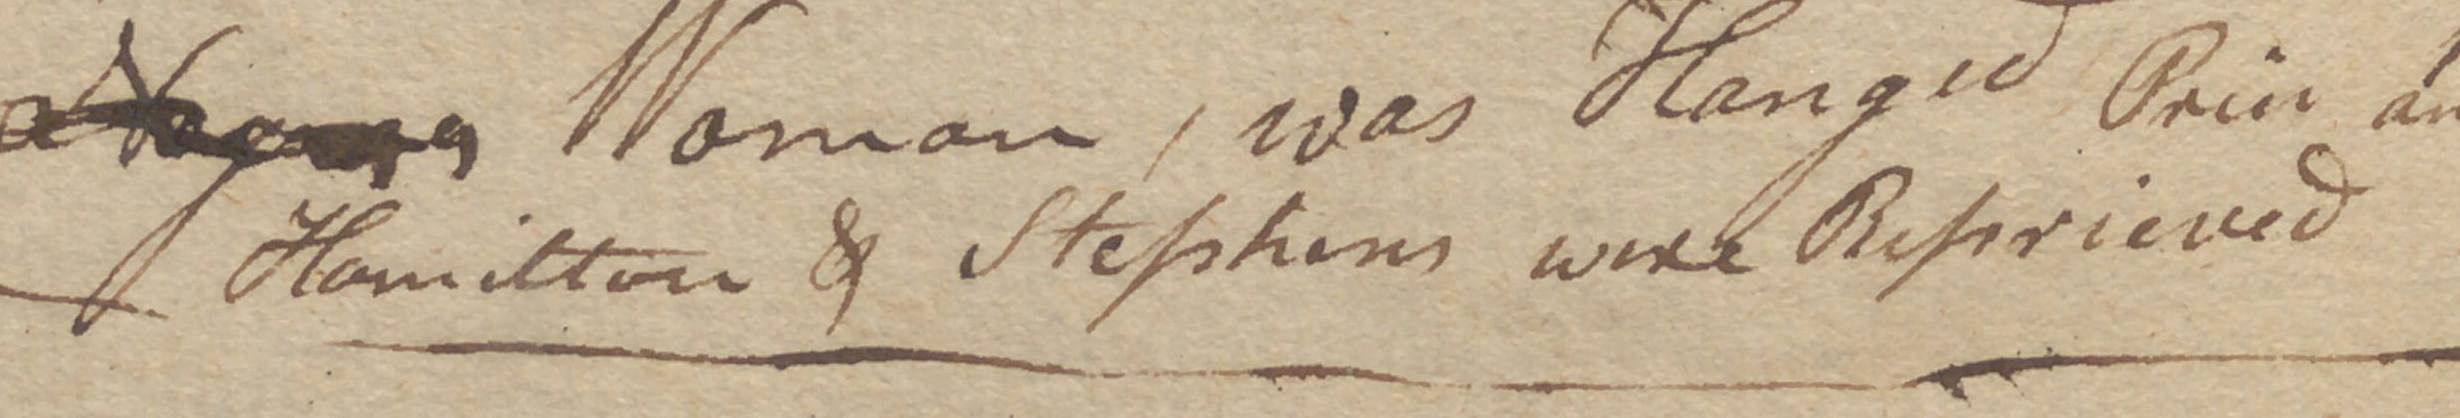Hamilton & Stephers were Reprieved
